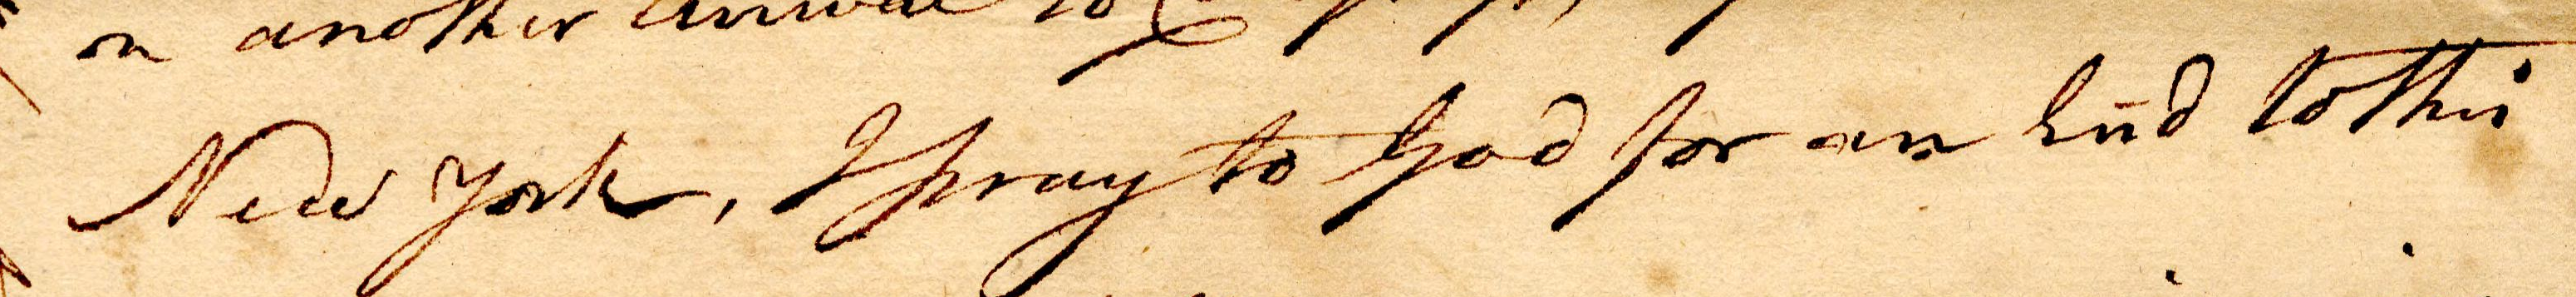New york, I pray to God for an End to this
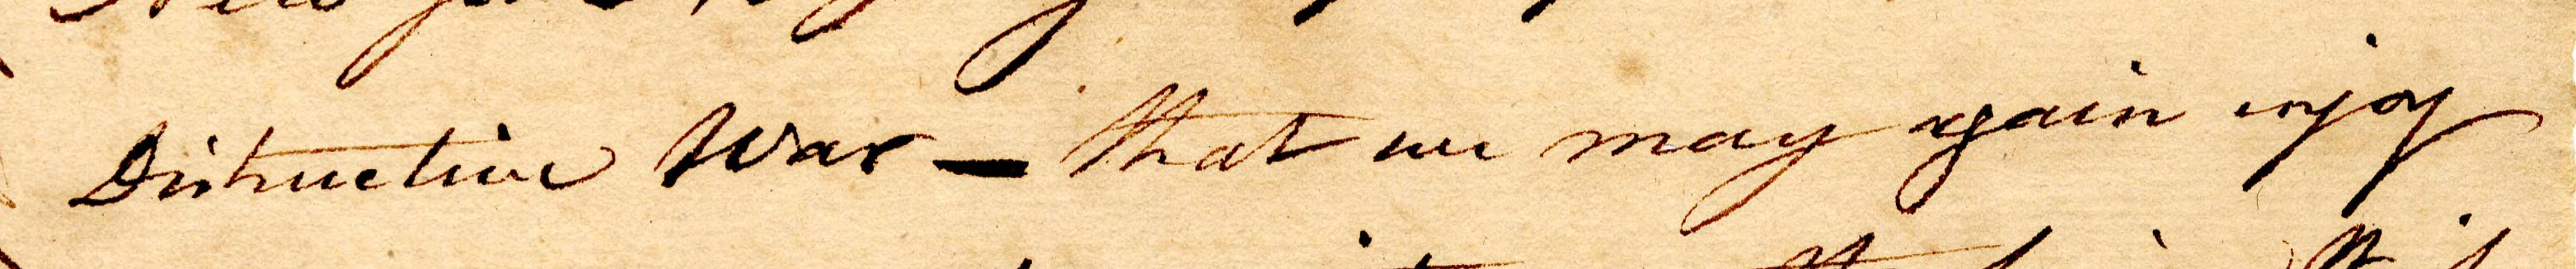Destructive war.- that we may again enjoy
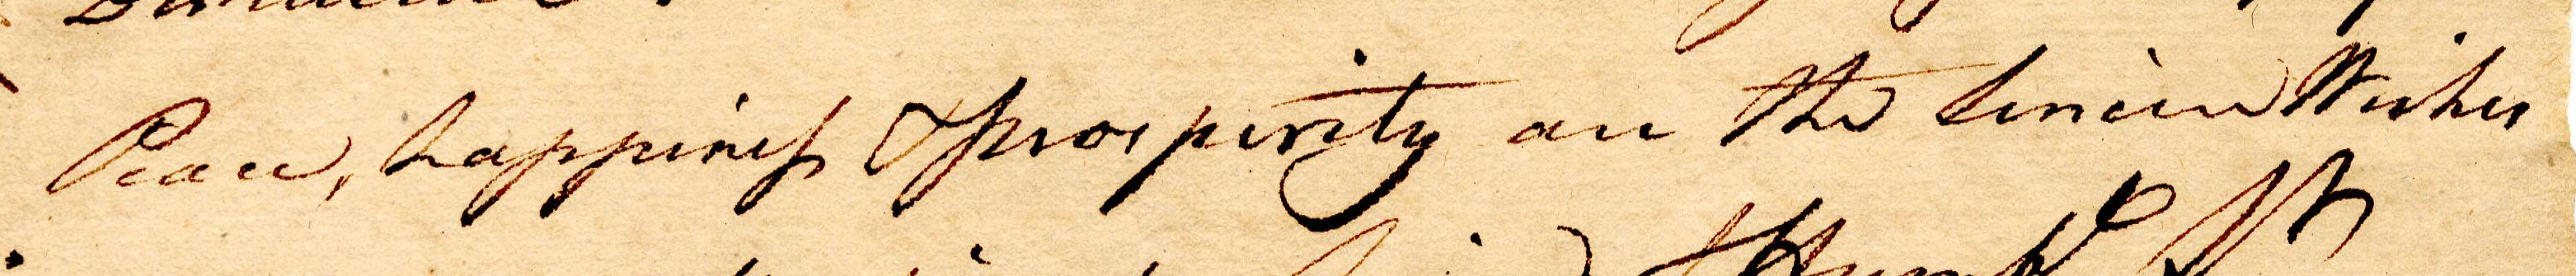Peace, happiness & prosperity are the sincere Wishes
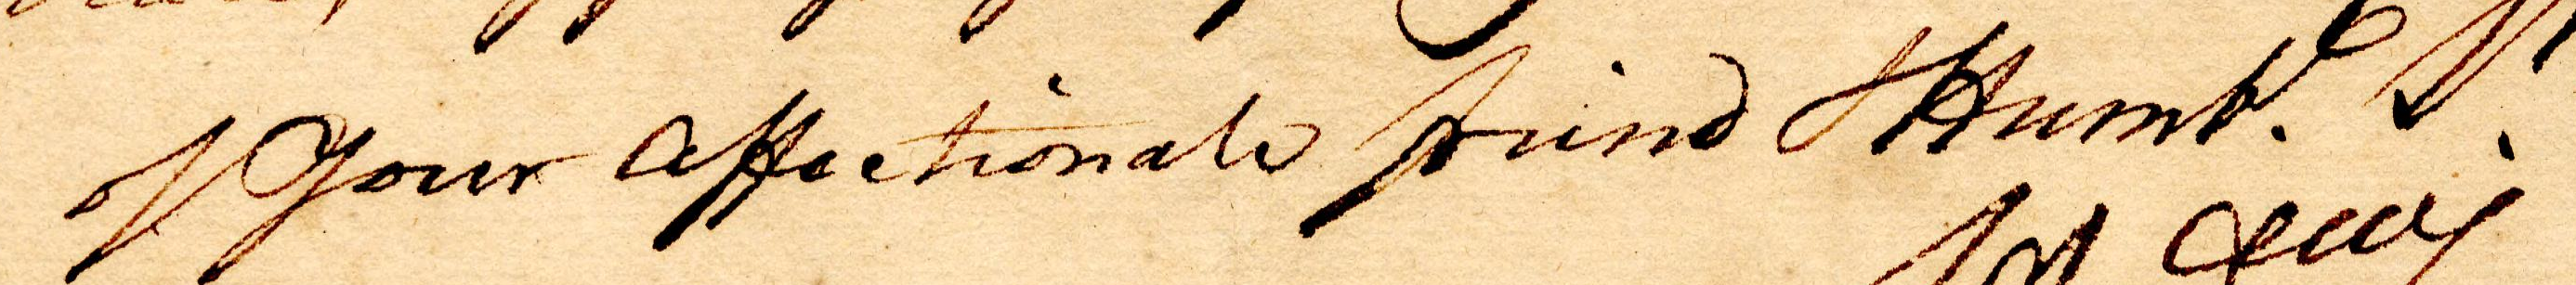of Your Affectionate friend & Humb^l. S^t.
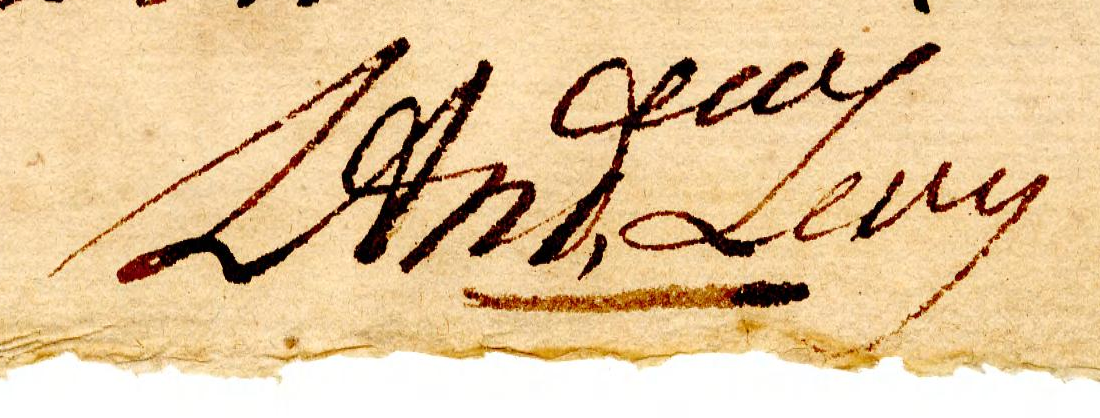And^rew Levy
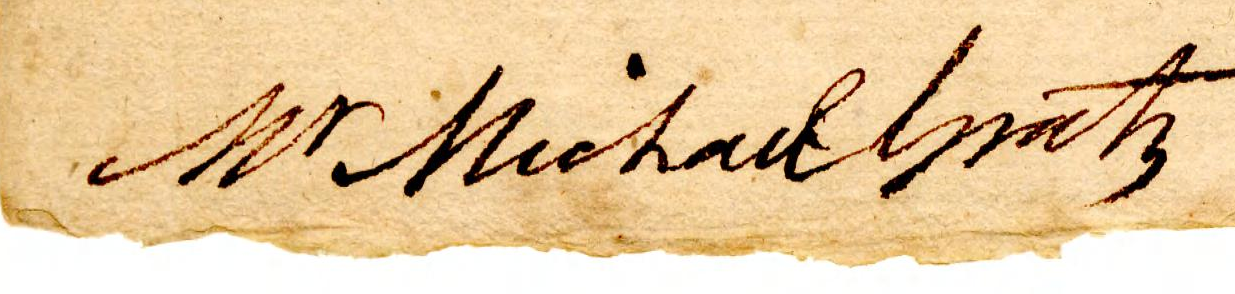M^r Michael Gratz
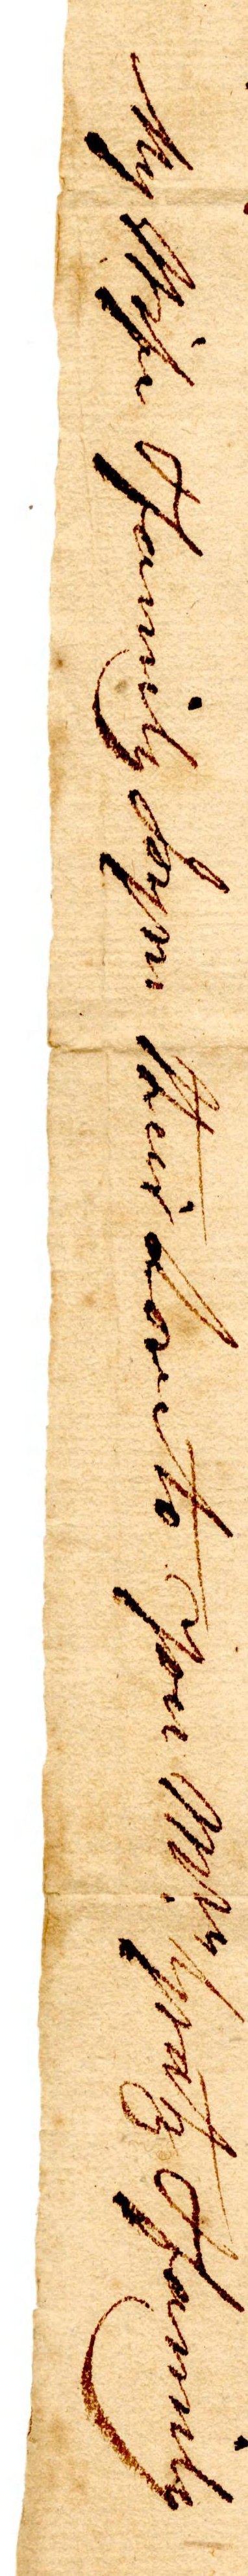My wife & family joyns their Love to You M^rs Gratz & family
